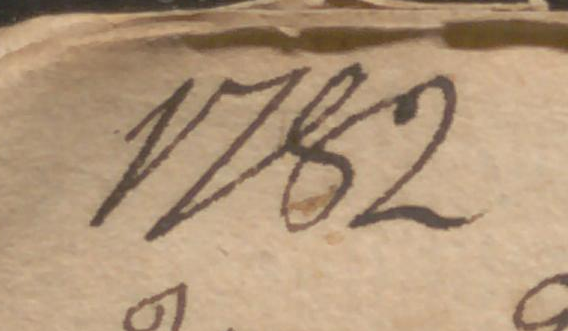1782
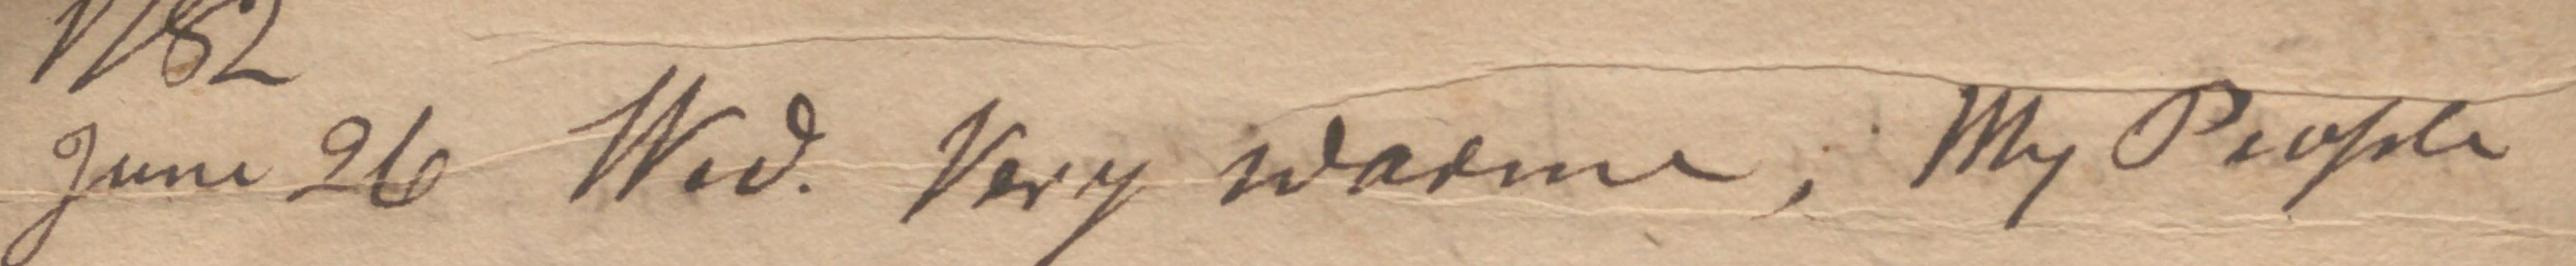June 26 Wed. Very warme, My People
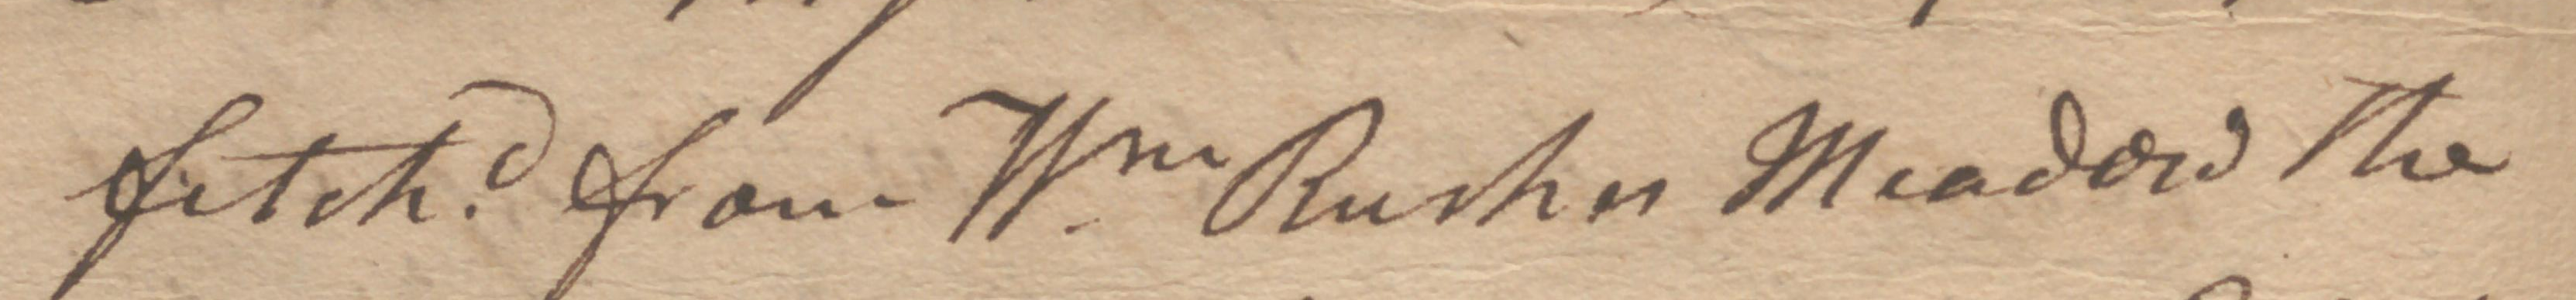fetch^d. from W^m. Rushes Meadow the
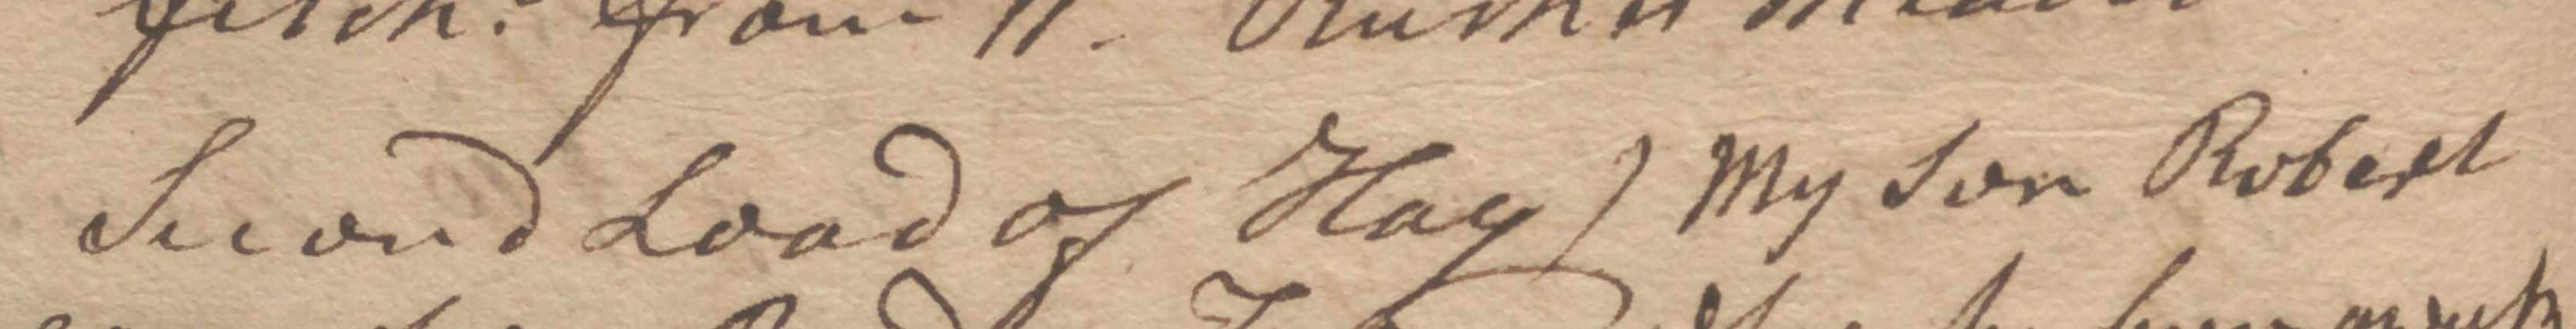second Load of Hay ) My son Robert
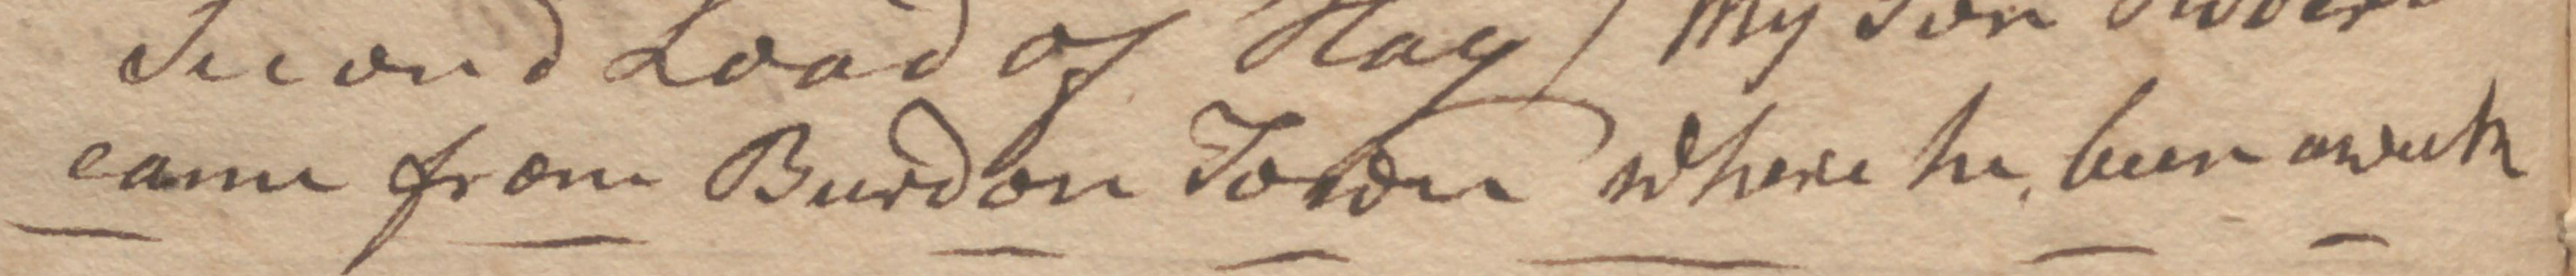came from Burdon Town where he been a week
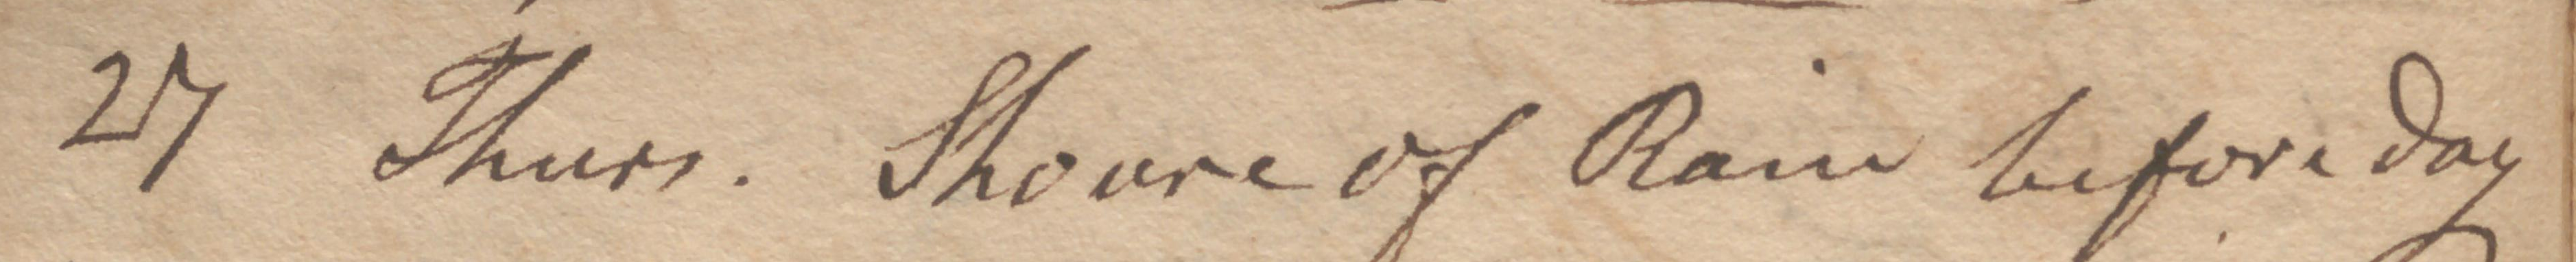27 Thurs. Shoure of Rain before day
